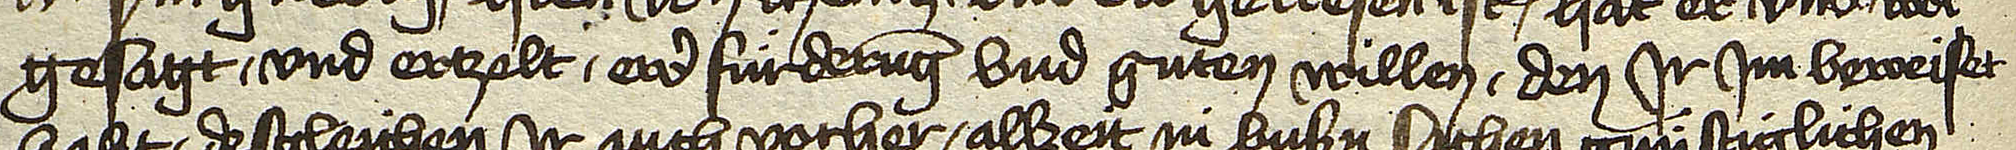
geſagt / vnd ertʒelt / ew* fürderug* vnd guten willen / den Ir Im beweiſet
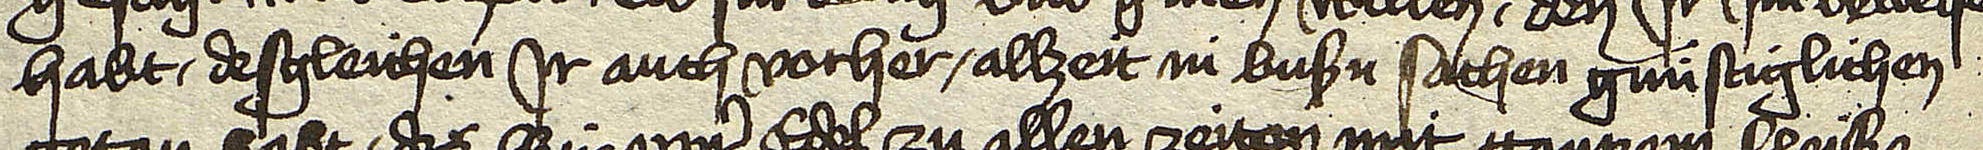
habt / deſgleichen Ir auch vorher / allcʒeit in vnſ*n ſachen günſtiglichen
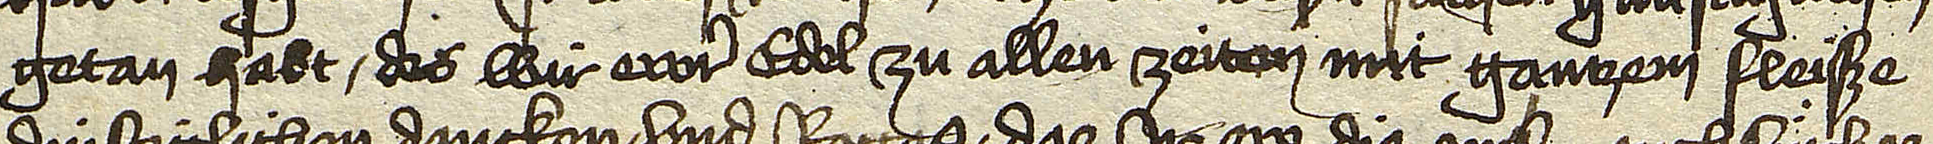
getan habt / des wir ewr* Edel cʒu allen cʒeiten mit gantʒem fleiſʒe
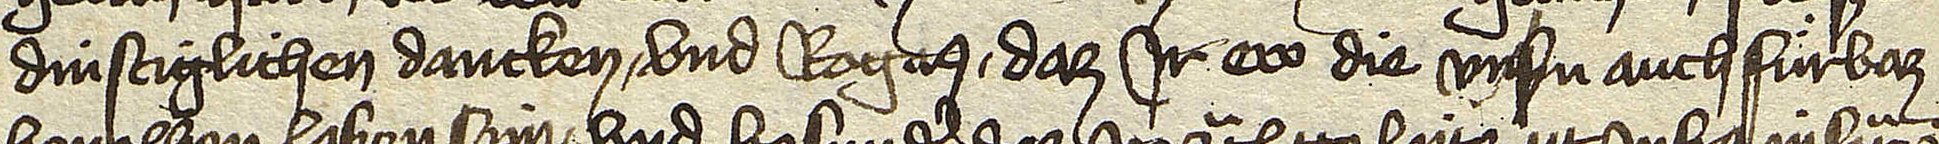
dinſtiglichen dancken / vnd Roga* / daʒ Ir ew die vnſ*n auch fürbaʒ
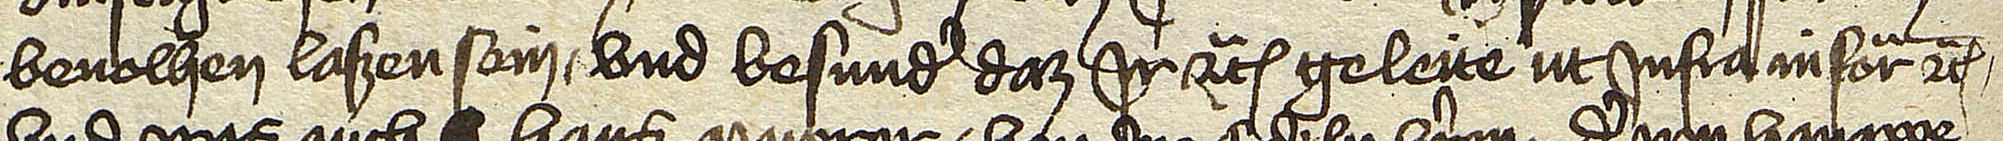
beuolhen laſʒen ſein / vnd beſund* daʒ Ir ec* geleite ut Infra in for* ec* /
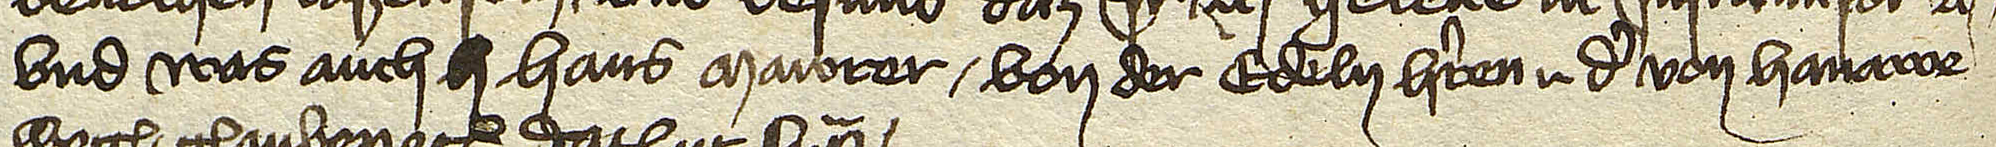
vns was auch h hans Mawrer / von der Edeln h*ren ~ d* von hanawe
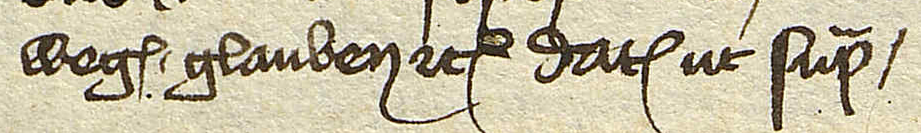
weg* / glauben ec* dat* ut ſup* /
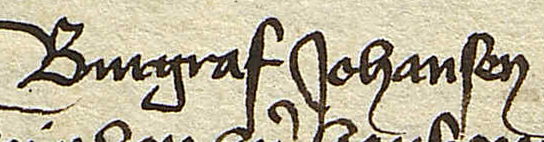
Burgraf Iohanſen
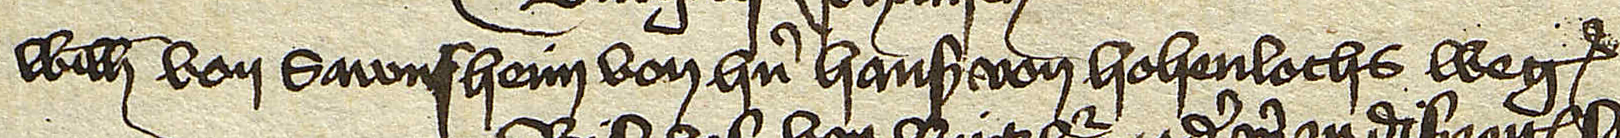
wilh* von Sawnſheim von hn* hanſ* von hohenlochs weg*
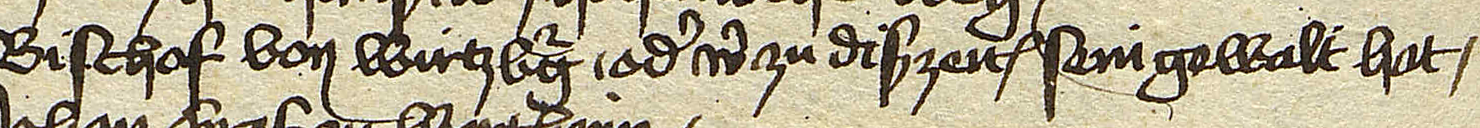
Biſchof von wirtʒbg* / od* w* cʒu diſ* ʒeit* ſein gewalt hat /
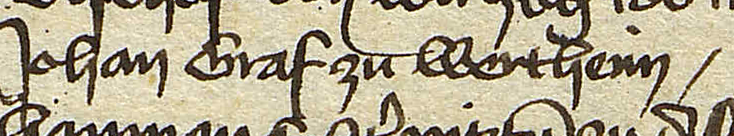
Iohan Graf ʒu wertheim /
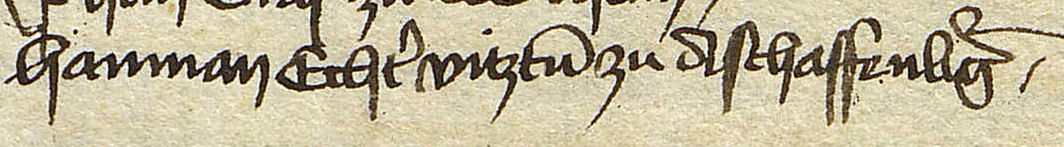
hanman Echt* vitʒtu* cʒu Aſchaffenb*g /
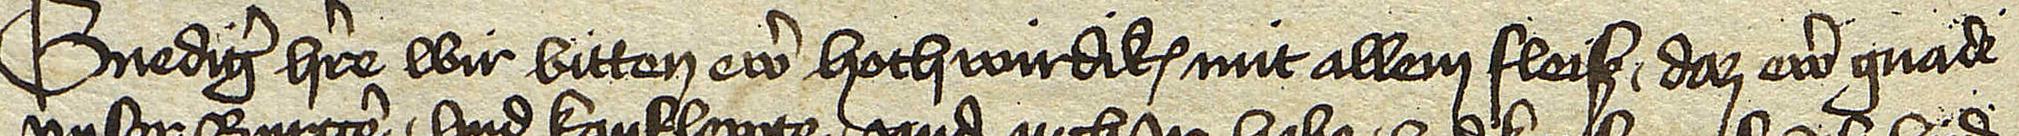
Gnedig* h*re wir bitten ew* hochwirdik* mit allem fleiſʒ / daʒ ew* gnade
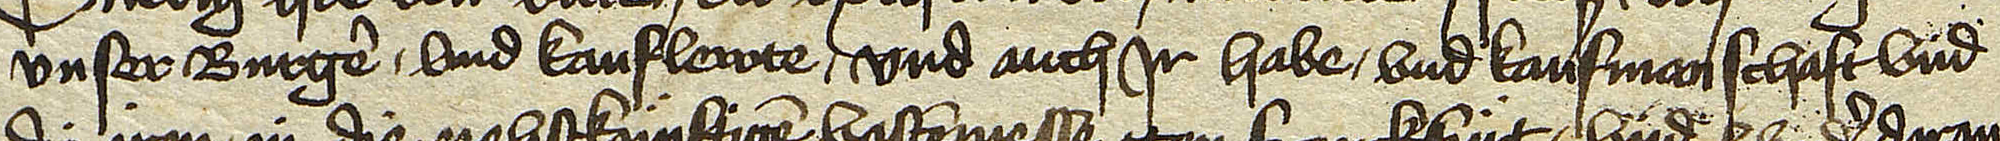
vnſer Burge* / vnd kauflewte / vnd auch Ir habe / vnd kaufmanſchaft vnd
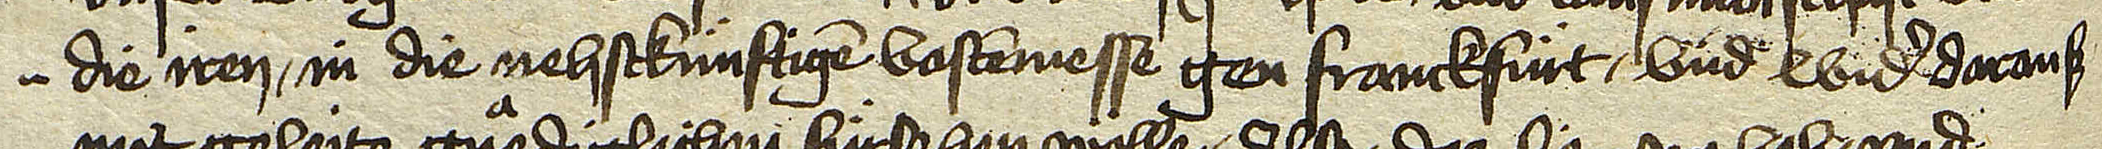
~ die iren / in die nehſtkünftige* vaſte*meſſe gen frankfürt / vnd wid* darauſʒ
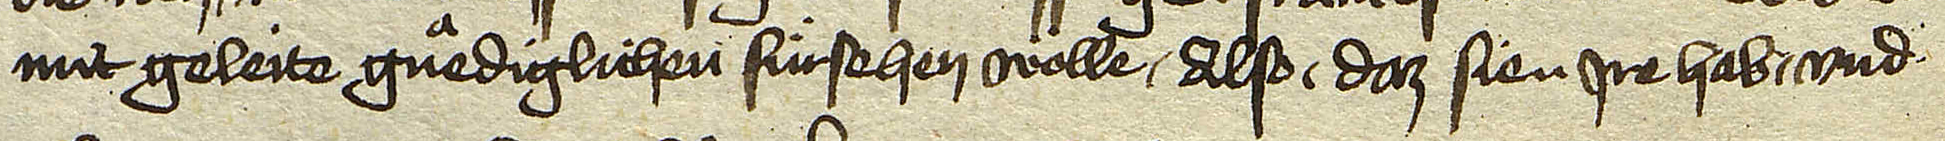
mit geleite gnëdiglichen fürſehen wölle / Alſo / daʒ ſie ~ Ire hab / vnd
